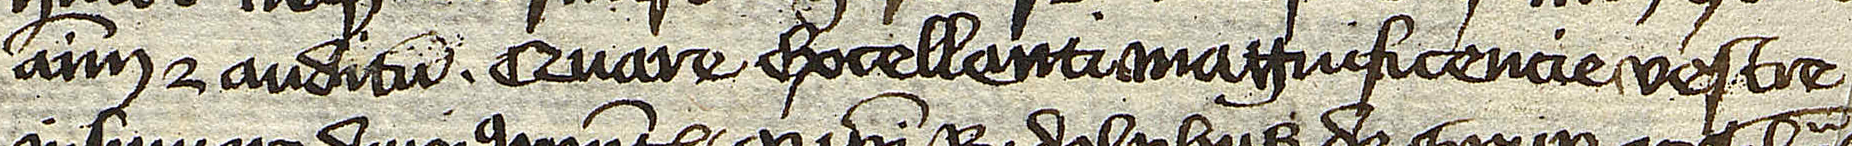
a*i*m @ auditu* . Quare Excellenti magnificencie veſtre
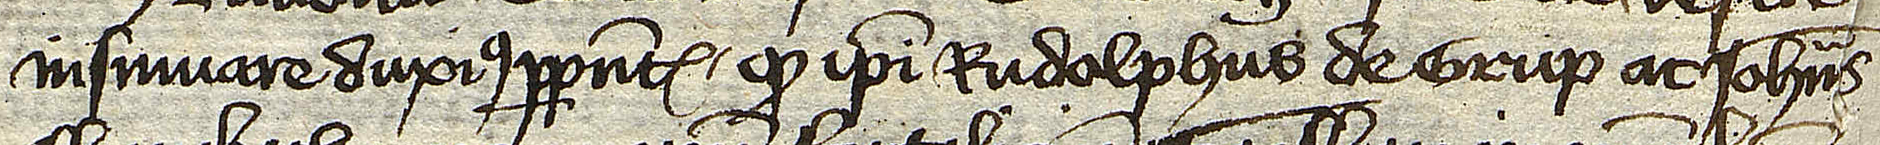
inſinuare duxi* p*p*ntes / q* ip*i Rudolphus de Grup ac Ioh*n*s
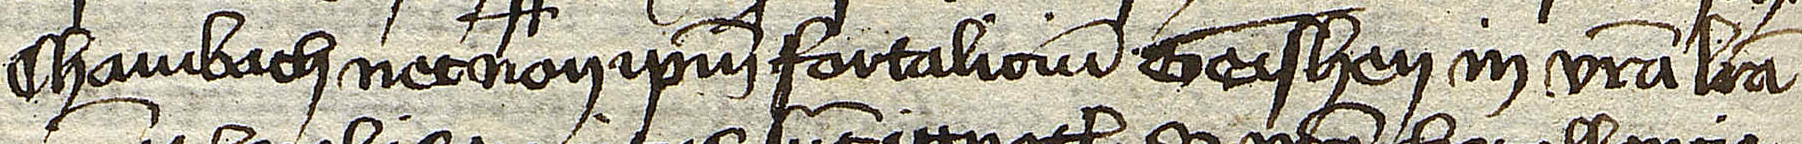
Chambath necnon ip*m fortaliciu* Geiſhen in v*ra l*ra
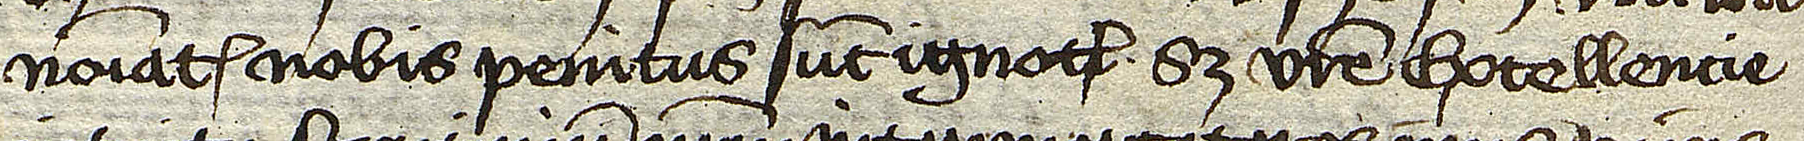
no*i*at* nobis pernitus ſ*ut ignot* . S* v*re Excellencie
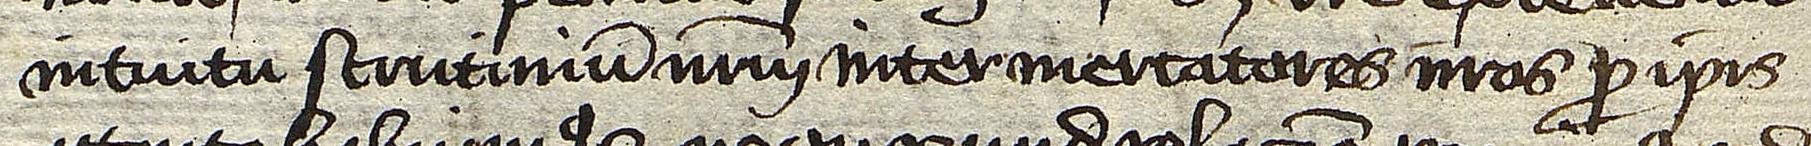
intuitu ſtrutiniu* n*r*m inter mercatores n*ros p* ip*is
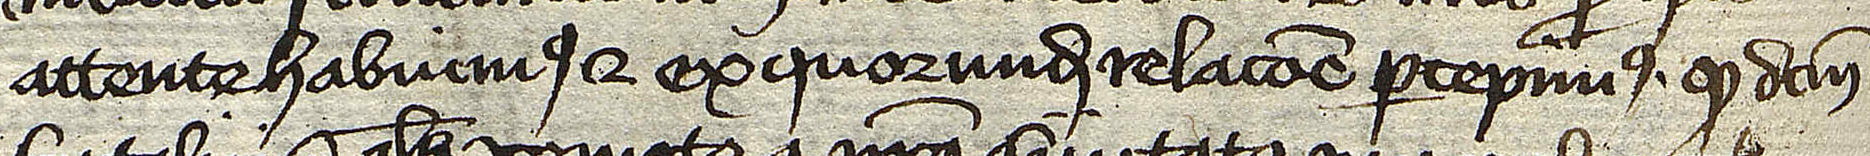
attente habuim* @ ex quorund* relac*o*e p*cepim* . q* d*t*m
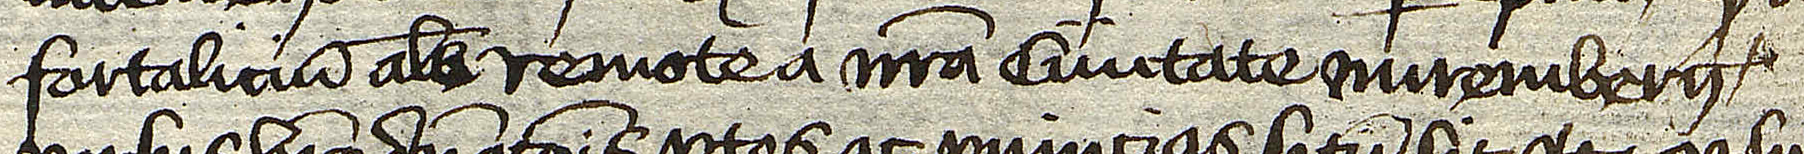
fortaliciu* al*s remote a n*ra Ciuitate Nuremberg*
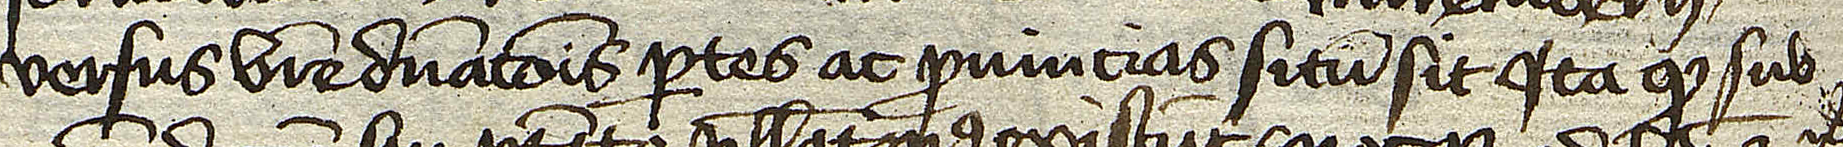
verſus v*re d*nac*o*is p*tes ac p*uincias ſitu* ſit Ita q* ſub
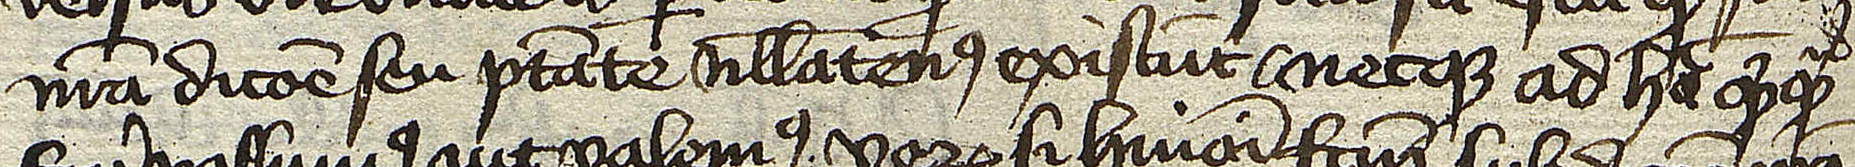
n*ra d*i*c*o*e ſeu p*tate n*llaten* exiſt*nt / necq* ad hoc q*q*
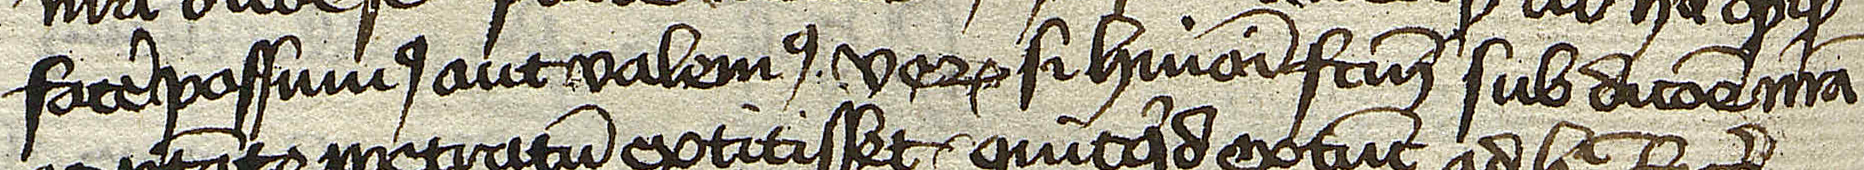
face* poſſum* aut valem* . Ve* ſi hui*o*i f*c*m ſub d*i*c*o*e n*ra
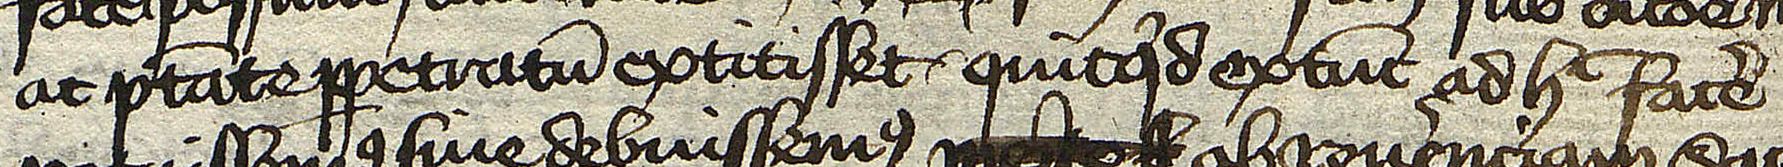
ac p*tate p*petratu* extitiſſet / quicq*d ext*nt ad h* face*
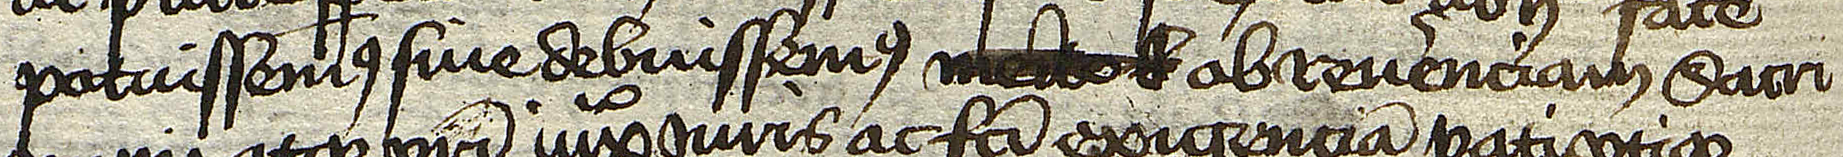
potuiſſem* ſiue debuiſſem* me%%* ob reue*nciam Sacri
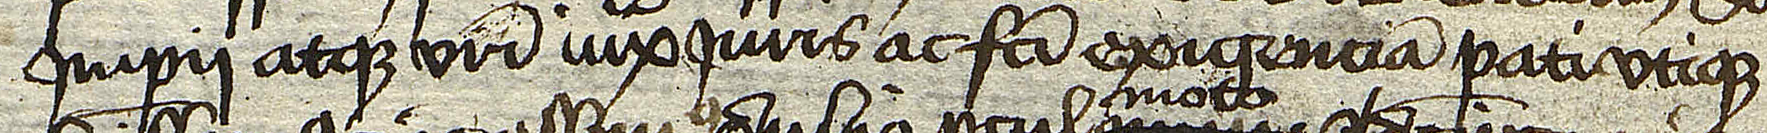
Imp*ii atq* v*ri iux* Iuris ac ſ*c*i exigentia* p*ati utiq*
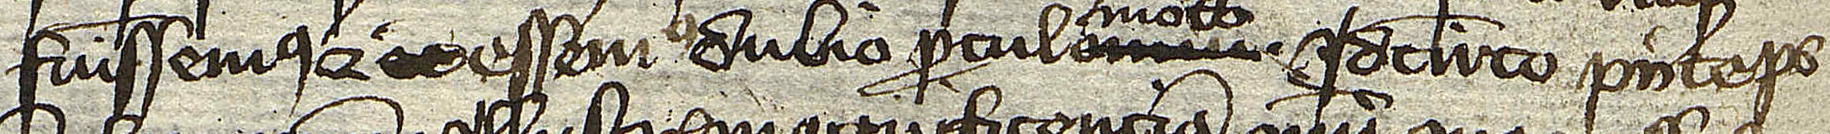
fuiſſem* @ %% eſſem* dubio p*cul%%%% Idcirco p*inceps
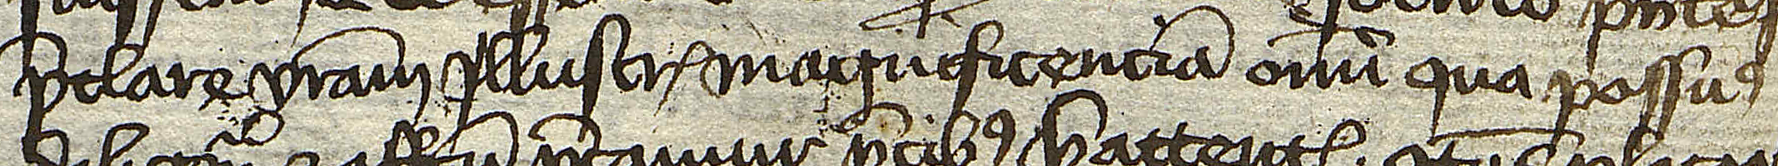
p*clare v*ram Illuſtr* magnificencia* om*i qua poſſu*
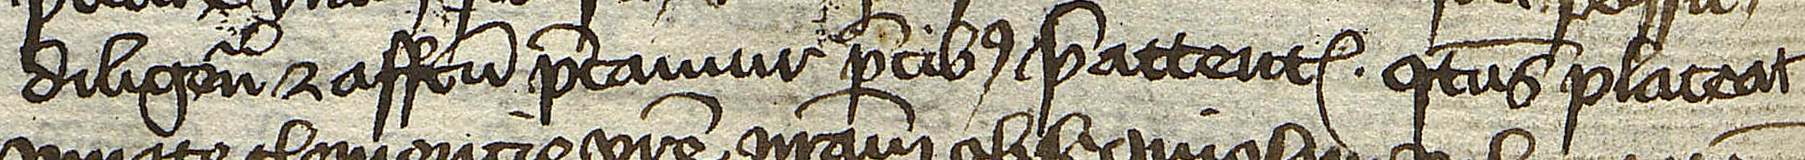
diligen* @ aff*tu* p*camur p*cib* p*attent* . q*t*us placeat
